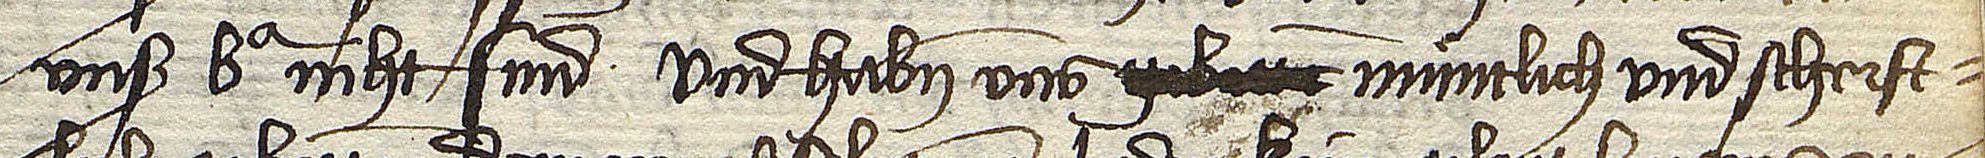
vnſ* b* niht ſind . vnd habn* vns gebette* müntlich vnd ſchrift =
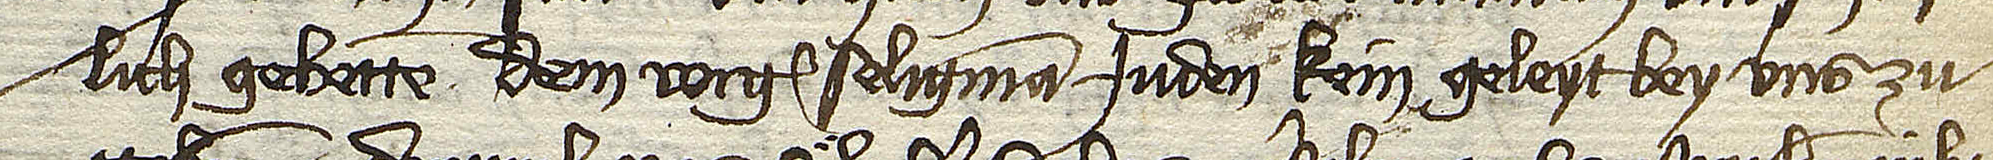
lich gebette* dem vorg* ſeligma* Iuden kein geleyt bey vns ʒu
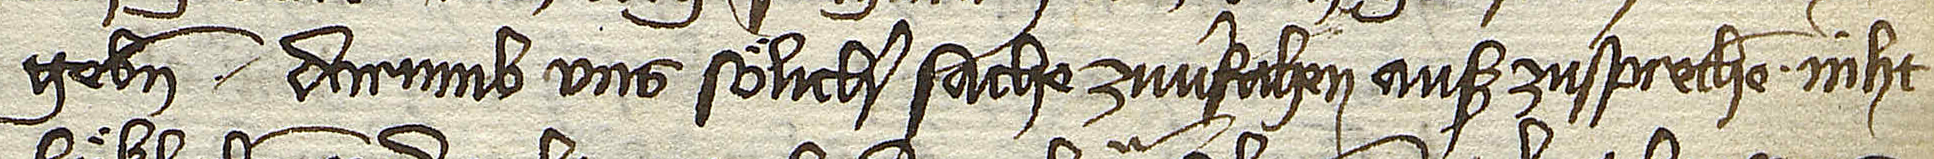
gebn* / Darumb vns ſölich* ſache ʒuu*fahen auſʒ ʒuſpreche* . niht
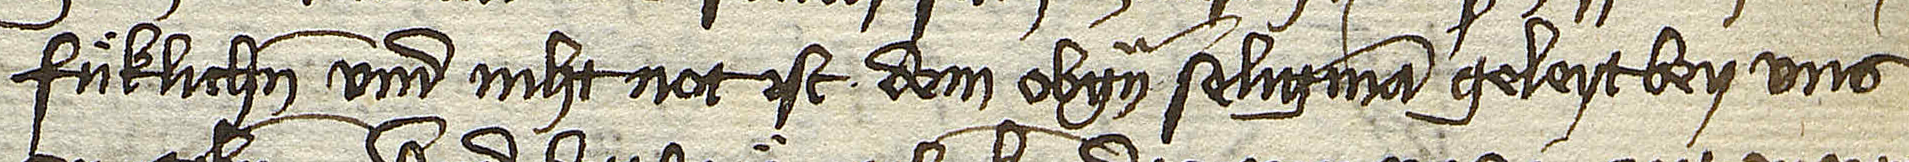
füklichn* vnd niht not iſt . dem obgn* ſeligma* geleyt bey vns
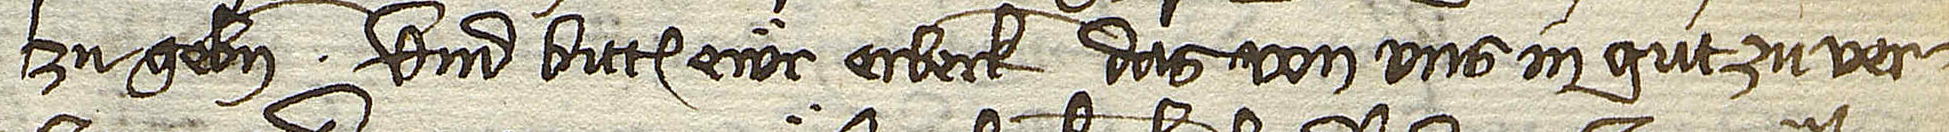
ʒu gebn* . Vnd bitt* eẅr erberk* das von vns in gut ʒu ver =
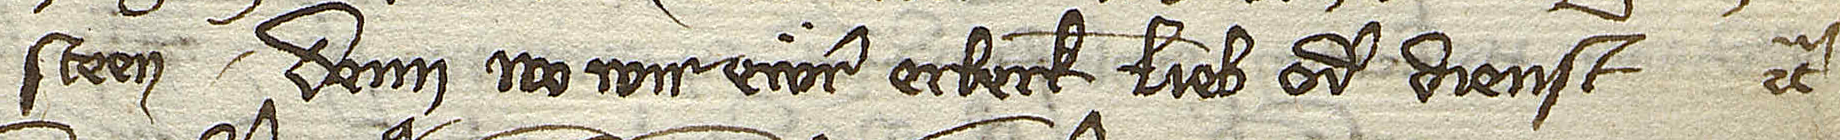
ſteen / Denn wo wir eẅr* erberk* lieb od* dienſt ec*
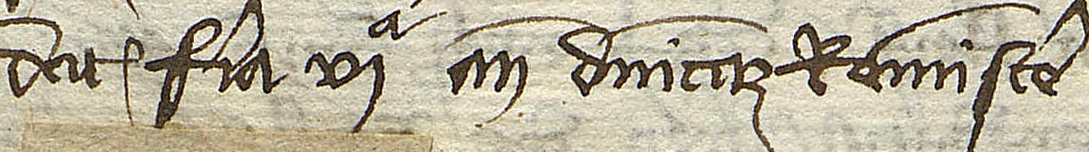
Dat* fi*a vi* an* d*nica* Remi*ſce*
